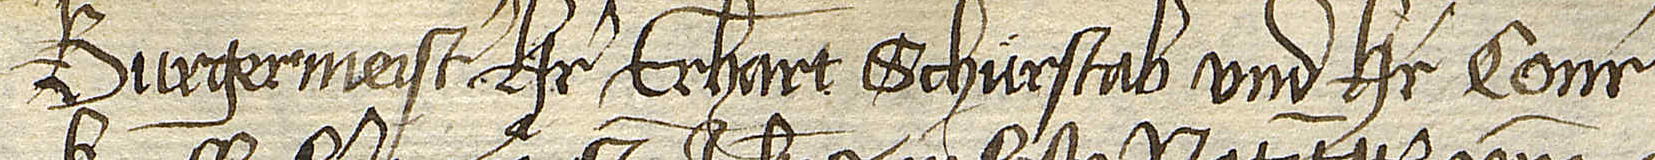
Burgermeiſt* Hr* Erhart Schürſtab vnd Hr* Conr*
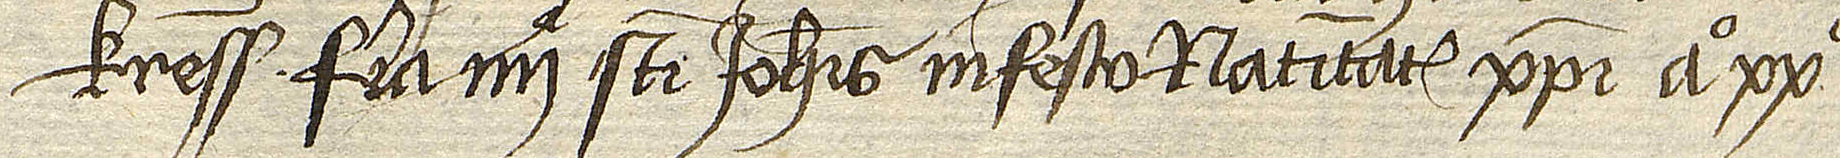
kreff . fi*a iiii* / ſci* Ioh*is in feſto Nati*tat* xpi* a* xx*
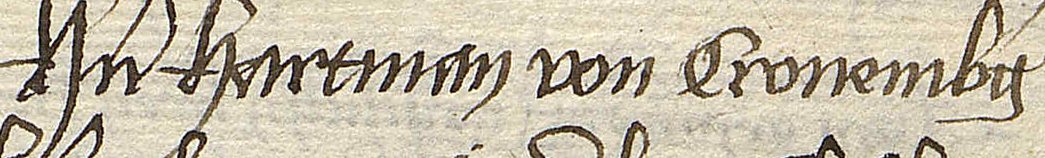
Hn* Hartman von Cronemb*g
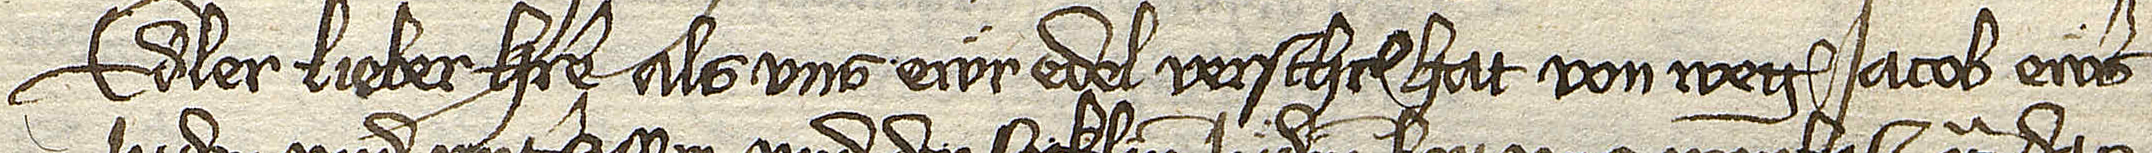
Edler lieber h*re als vns eẅr edel verſchr* hat von weg* Iacob eẅ*s
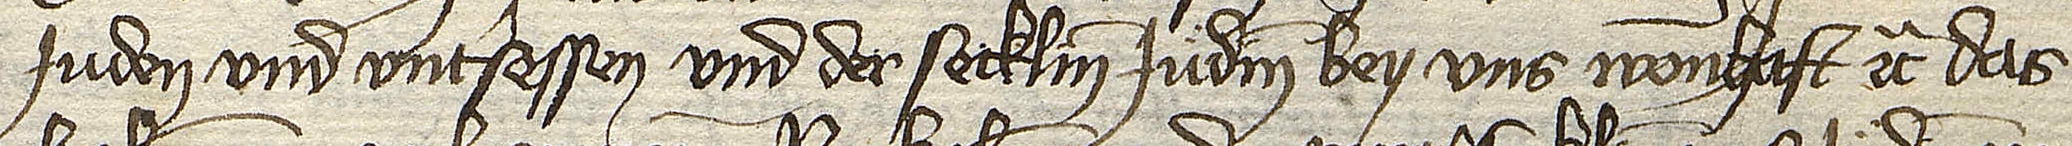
Iuden vnd vnt*ſeſſen vnd der ſecklin* Iüdin* bey vns wonhaft ec* das
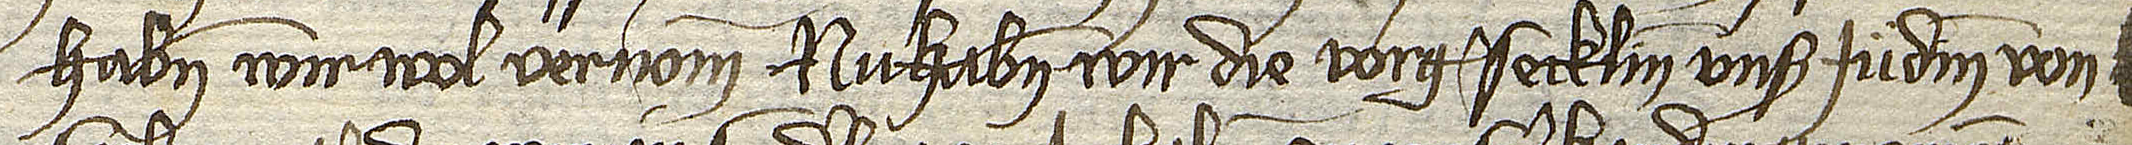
habn* wir wol vernom* . Nu habn* wir die vorg* ſecklin* vnſ* Iüdin* von
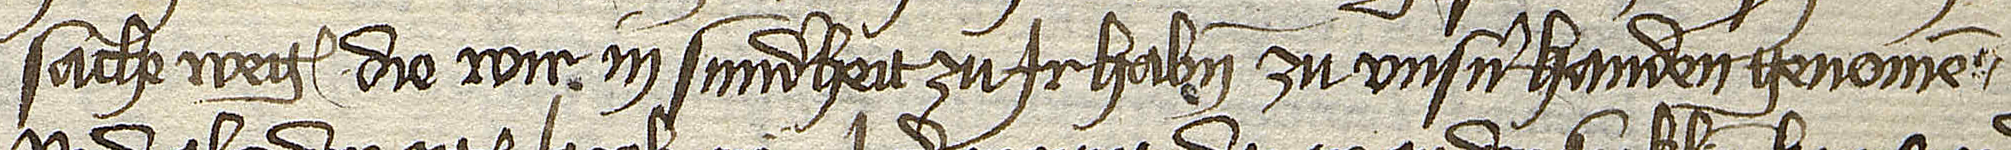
ſache weg* . die wir in ſund*heit ʒu Ir habn* ʒu vnſn* handen genome* /
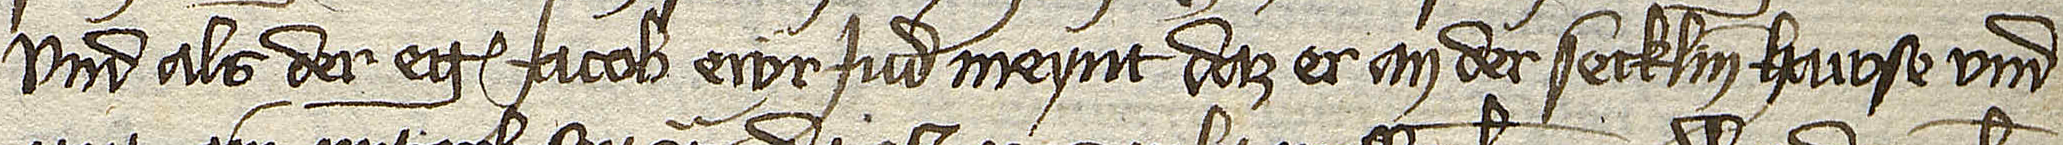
vnd als der eg* Iacob eẅr Iud meynt daʒ er an der ſecklin* hawſe vnd
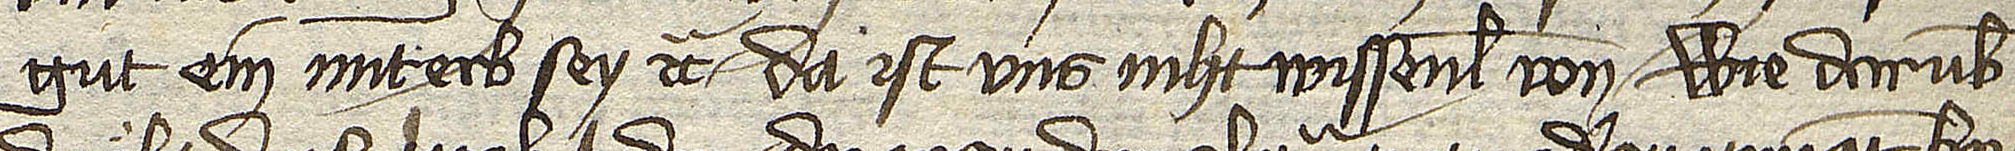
gut ein mit erb ſey ec* / Da iſt vns niht wiſſenl* von / Wie darub*
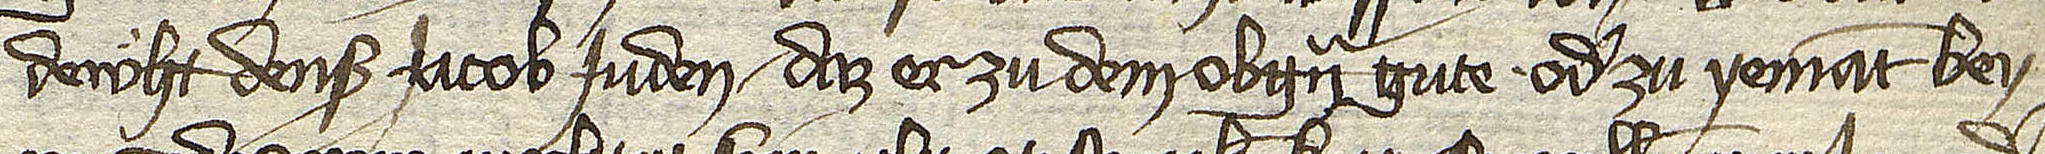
deẅht denſ* Iacob Iuden / daʒ er ʒu dem obgn* gute . od* ʒu yema*t bey
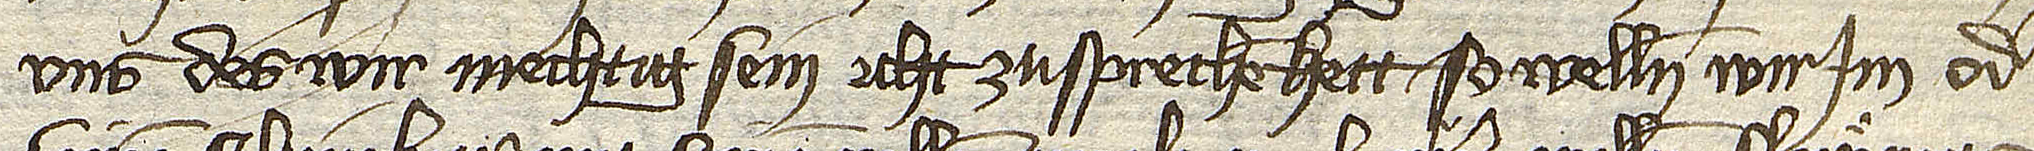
vns des wir mechtig ſein icht ʒu ſpreche* hett / ſo welln* wir Im od*
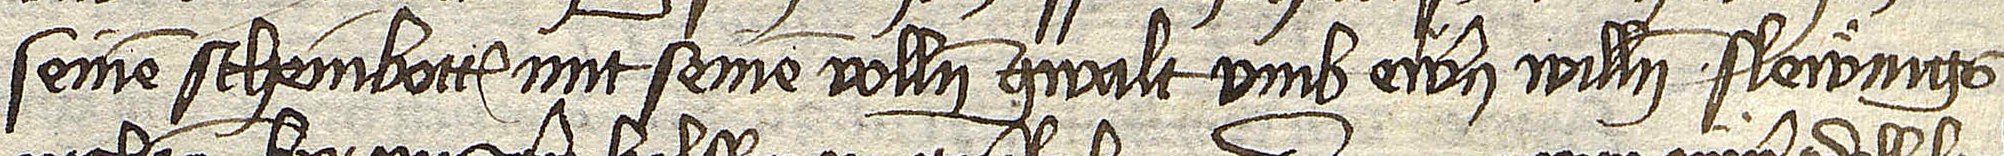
ſeine* ſcheinbott* mit ſeine* volln* gwalt vmb eẅ*n willn* . ſleẅnigs
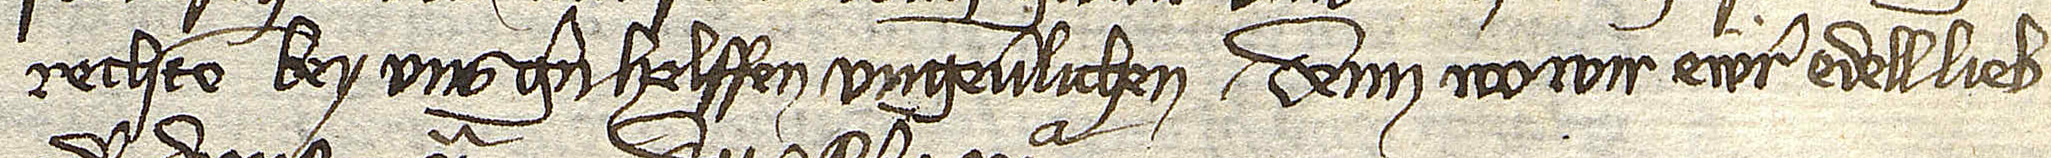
rechte* bey vns g*n helffen vngeu*lichen / Denn wo wir eẅr* edell lieb
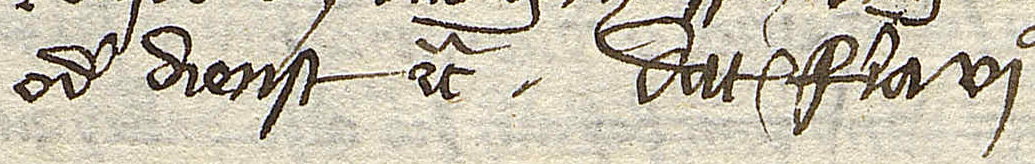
od* dienſt ec* / Dat* fi*a vi*
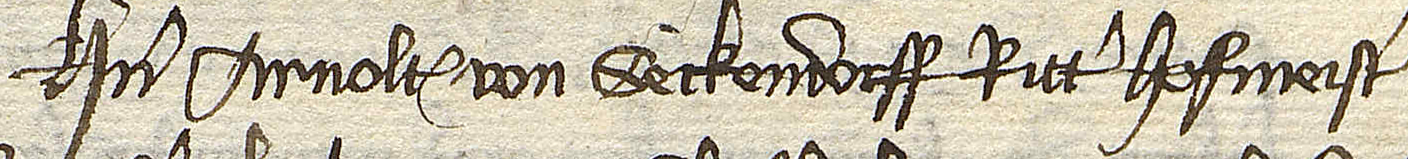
Hn* Arnolt* von Sëckendorff Ritt* hofmeiſt*
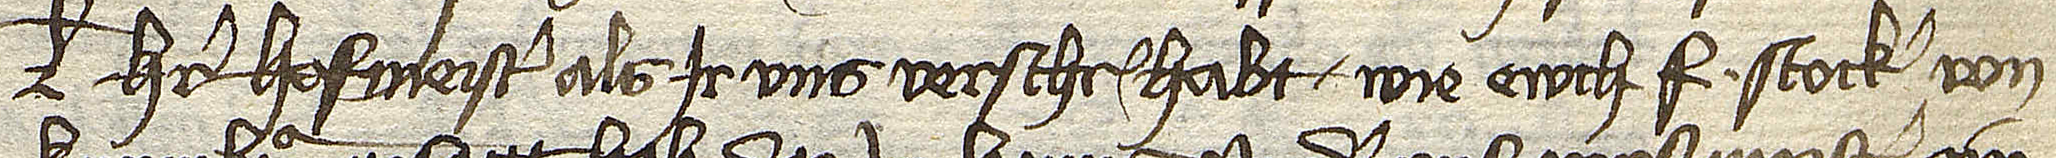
L* Hr* hofmeiſt* als Ir vns verſchr* habt / wie ewch F . ſtock* von
